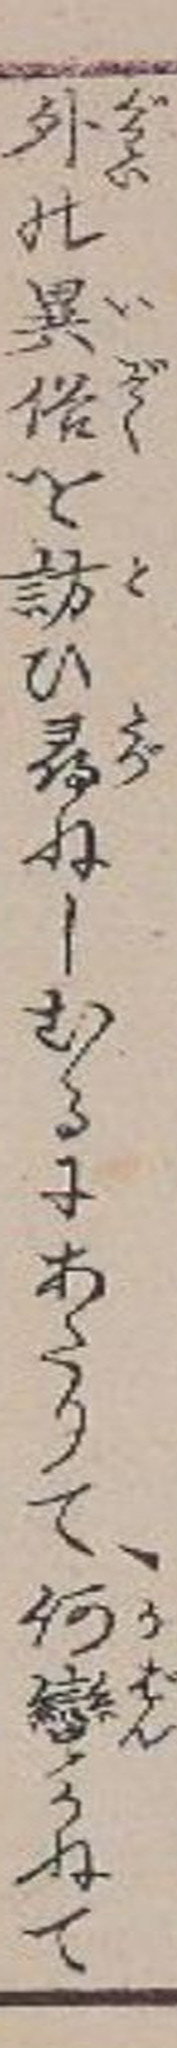外の異俗を訪ひ尋ねしむるにあたりて、何蛮かねて
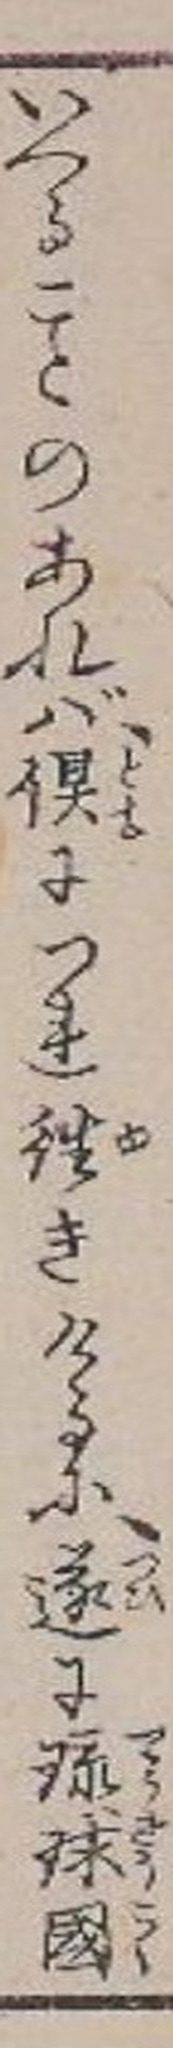いへることのあれば、倶につれ往きけるに、遂に琉球国
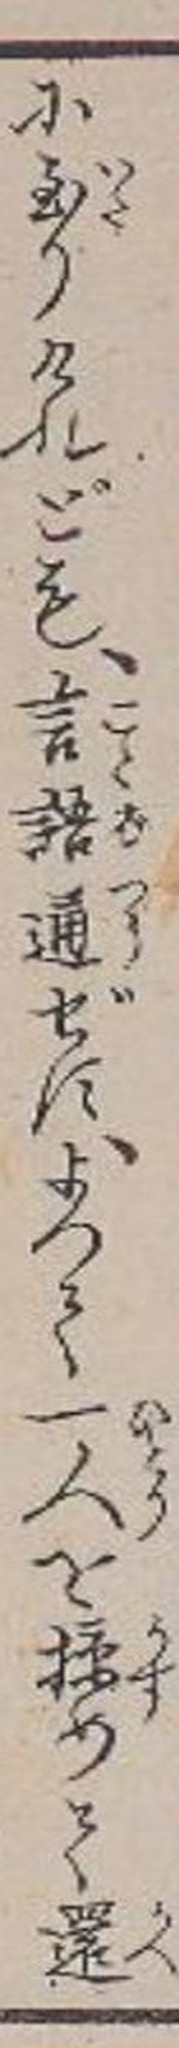に至りけれども、言語通ぜす、よつて一人を掠めて還
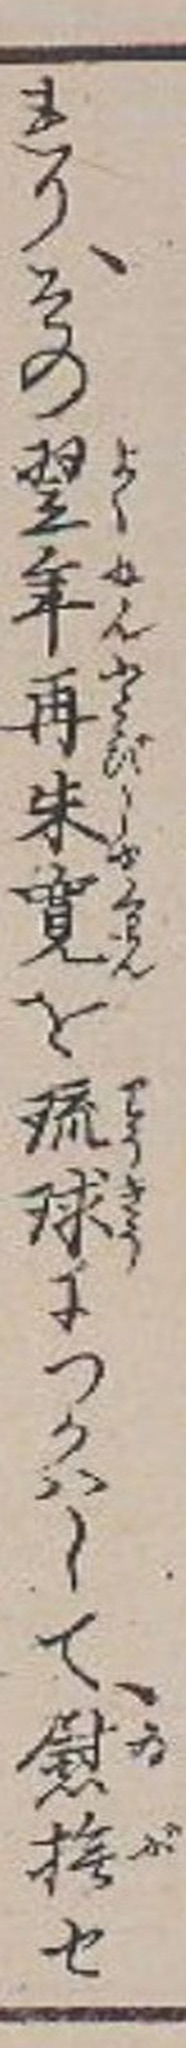れり、その翌年再朱寛を琉球につかはして、慰撫せ
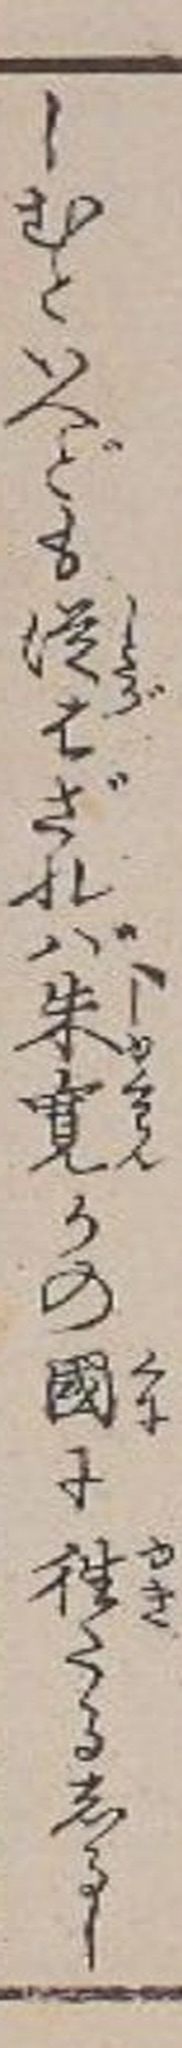しむといへども従はざれば、朱寛かの国に往たるしるし
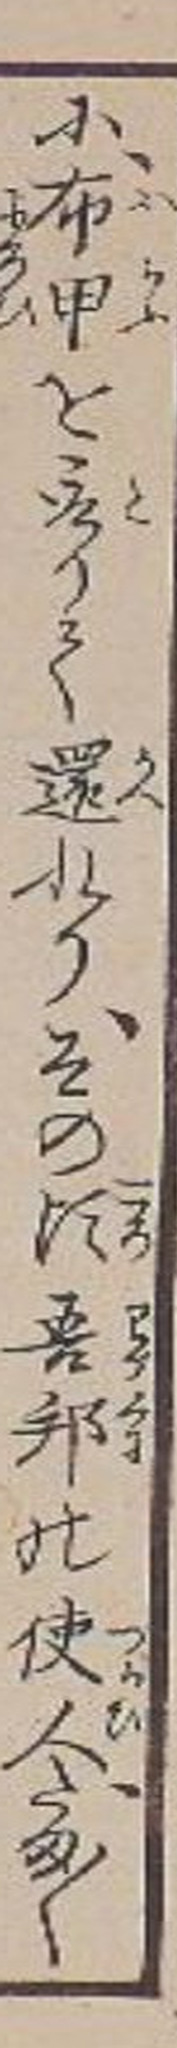に、布甲を取りて還れり、その頃吾邦の使人、たま〳〵
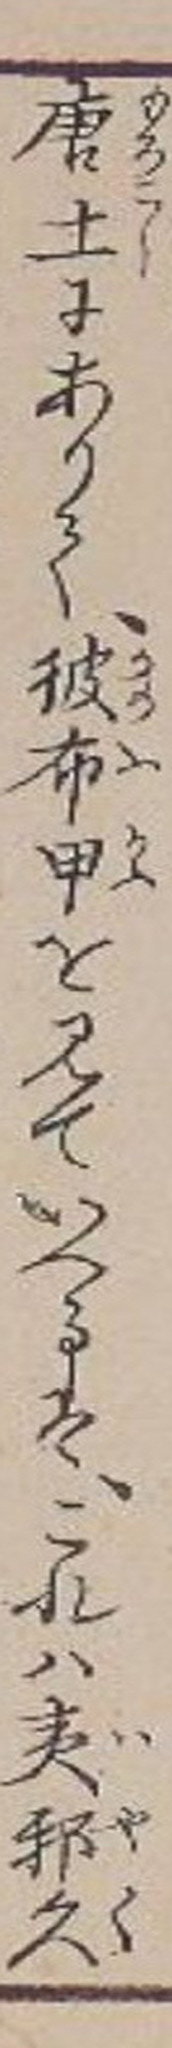唐土にありて、彼布甲を見ていへるは、これは夷邪久
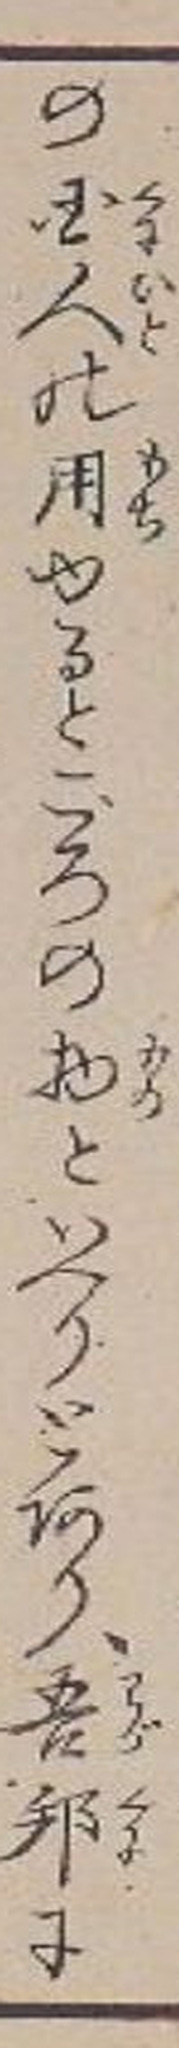の国人の用ゆるところの物といへりとあり、吾邦に
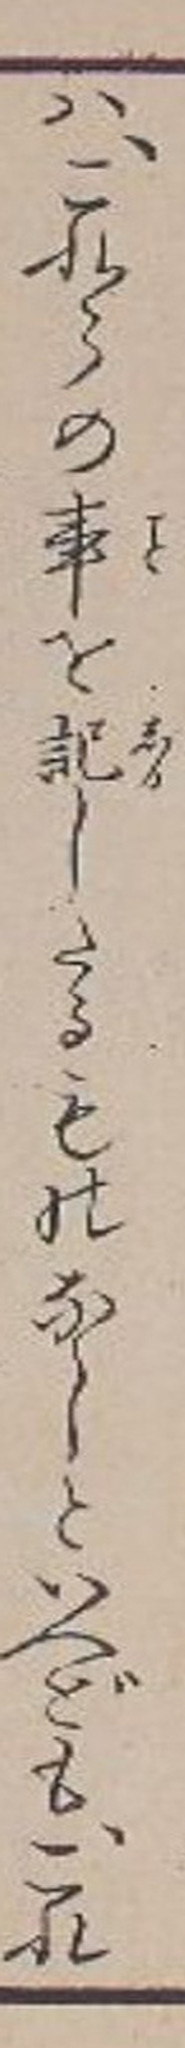は、これらの事を記したるものなしといへども、これ
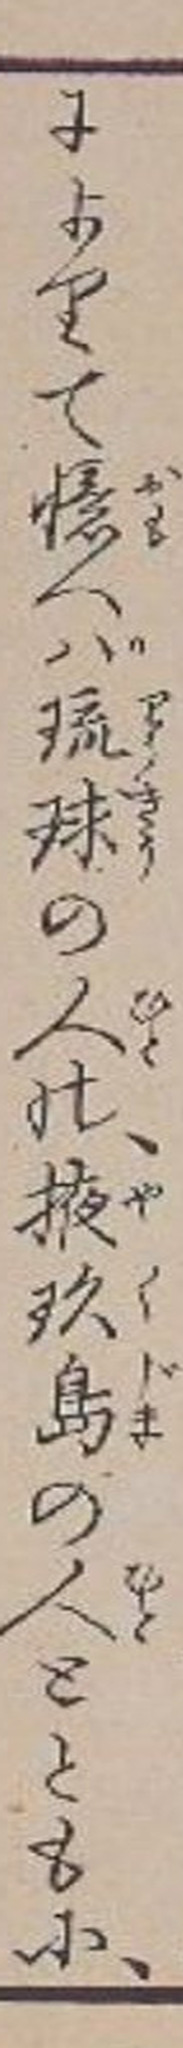によりて憶へば琉球の人の、掖玖島の人とともに、
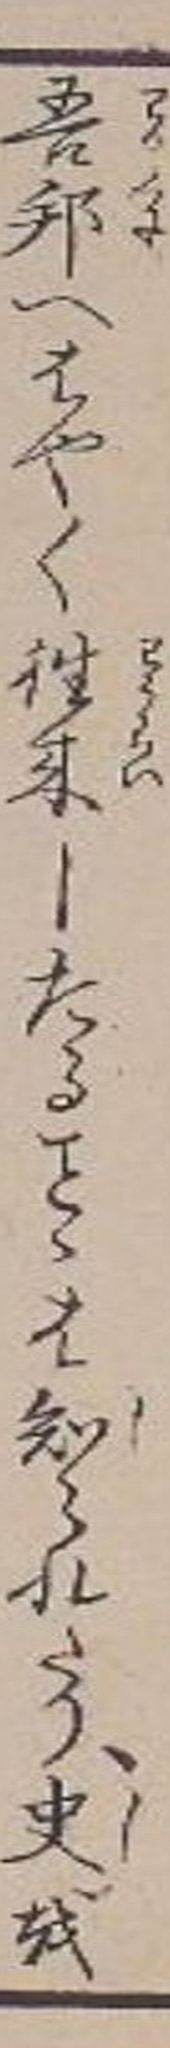吾邦へはやく往来したることゝは知られたり、史を
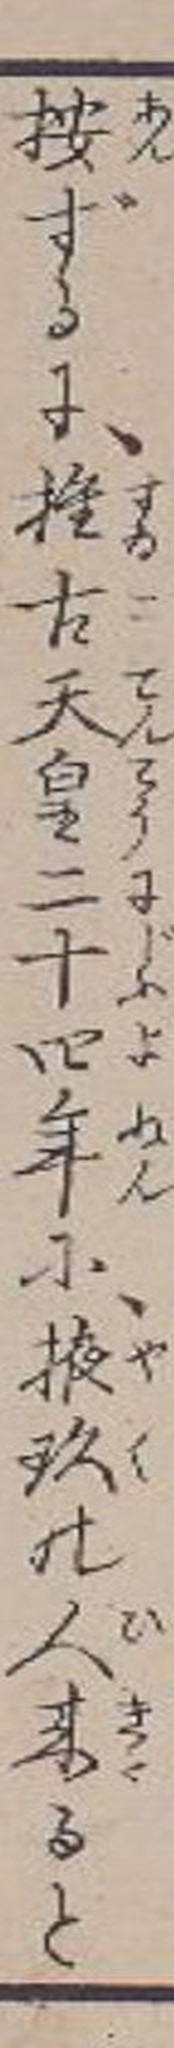按ずるに、推古天皇二十四年に掖玖の人来ると
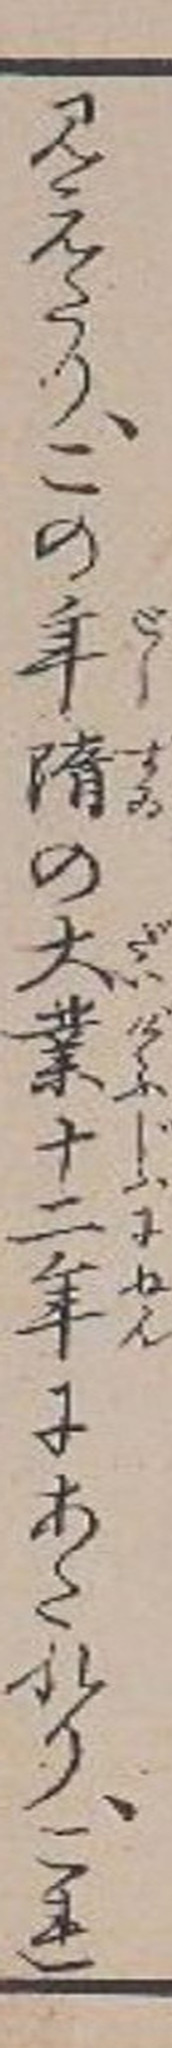見えたり、この年隋の大業十二年にあたれり、これ
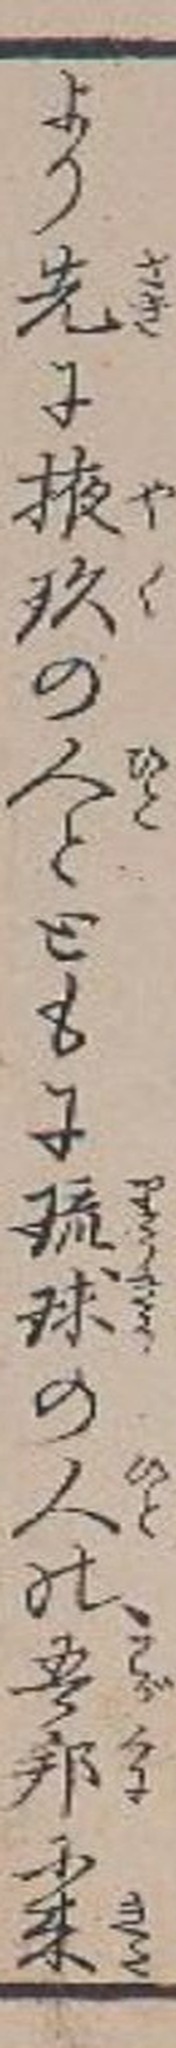より先に掖玖の人とともに琉球の人の、吾邦に来

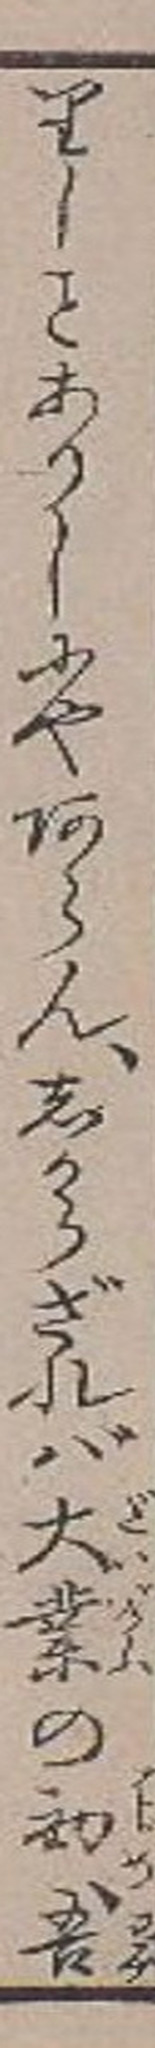りしことありしにやあらん、しからざれば大業の初、吾
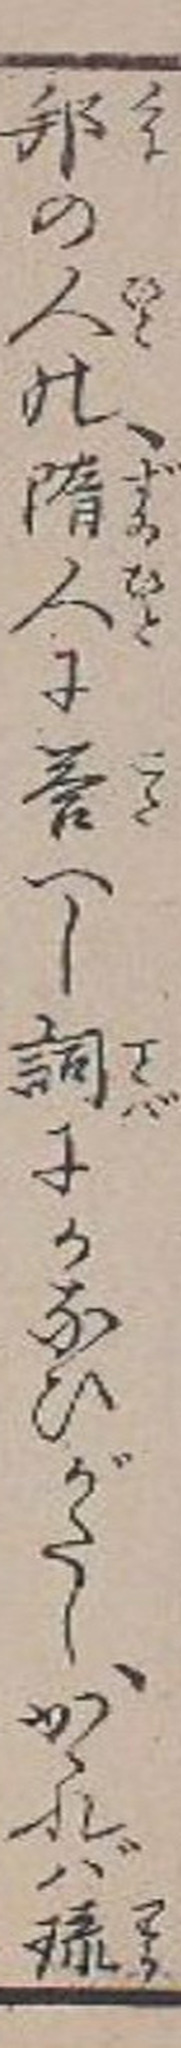邦の人の、隋人に答へし詞にかなひがたし、かゝれば琉
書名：琉球入貢紀略
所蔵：University of the Ryukyus Library
